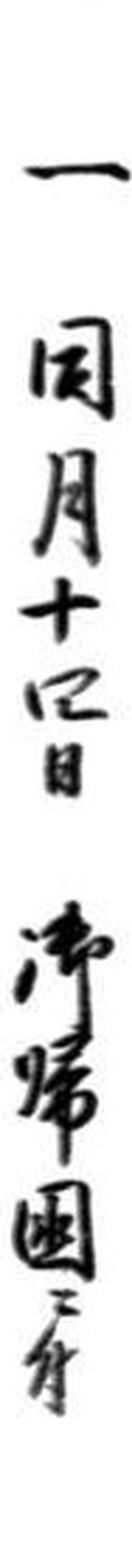一同月十四日御帰国ニ付
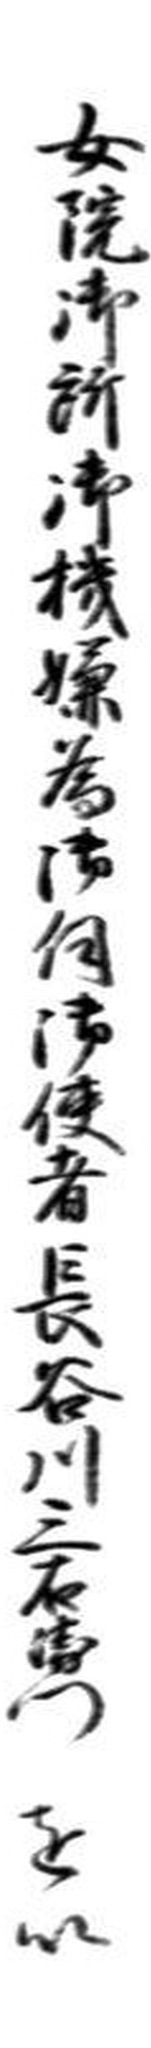女院御所御機嫌為御伺御使者長谷川三右衛門を以
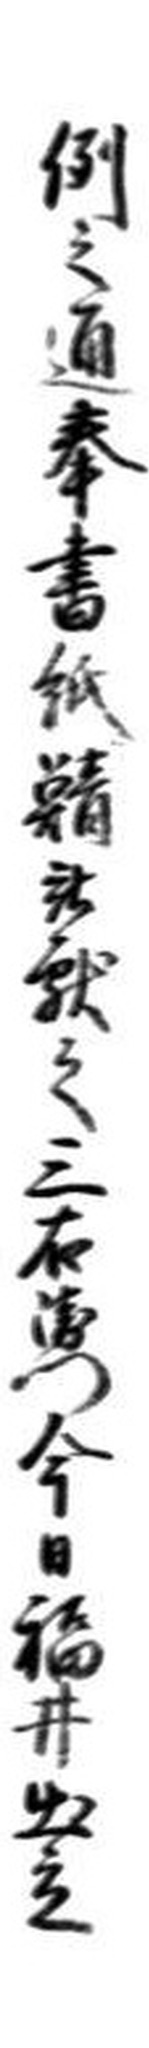例之通奉書紙鯖被献之三右衛門今日福井出立
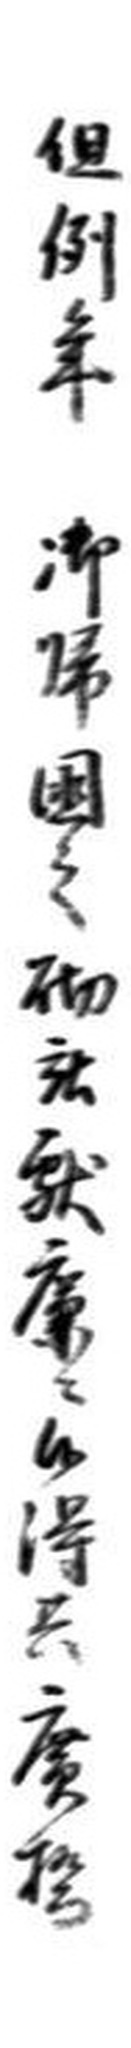但例年御帰国之砌被献廉ニ候得共広橋
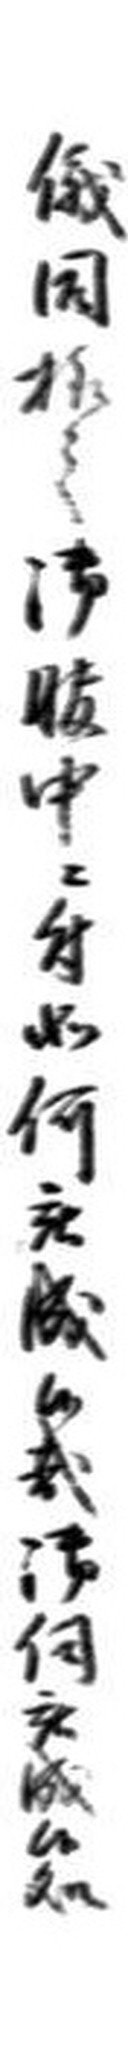儀同様之御服中ニ付如何被成候哉御伺被成候処
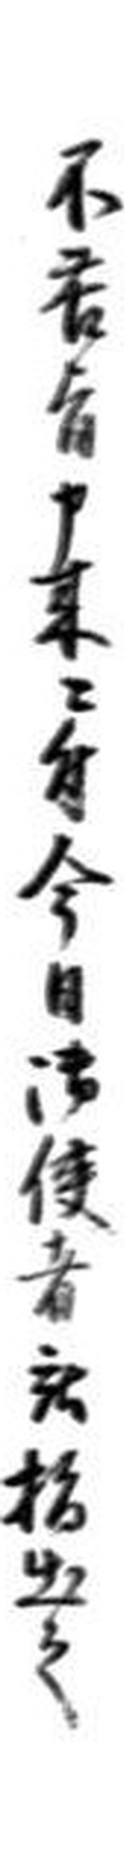不苦旨申来ニ付今日御使者被指出之

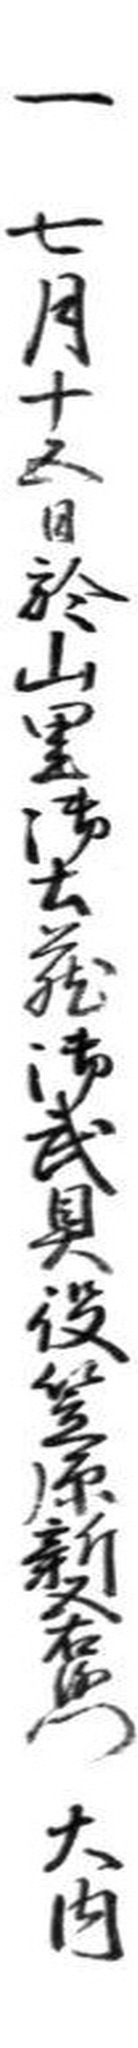一七月十五日於山里御土蔵御武具役笠原新五右衛門大内
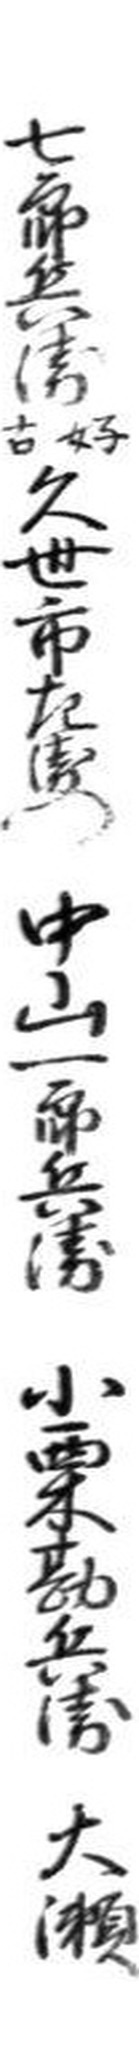七郎兵衛好古久世市左衛門中山一郎兵衛小栗勘兵衛大瀬
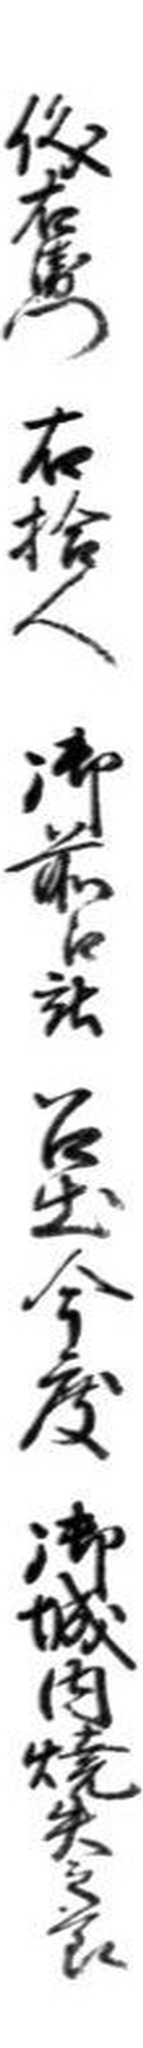儀右衛門右拾人御前江被召出今度御城内焼失之節
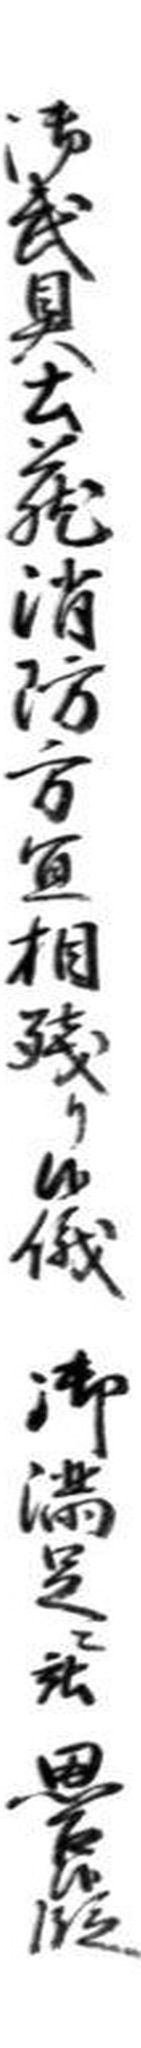御武具土蔵消防方宜相残リ候儀御満足ニ被思召候段
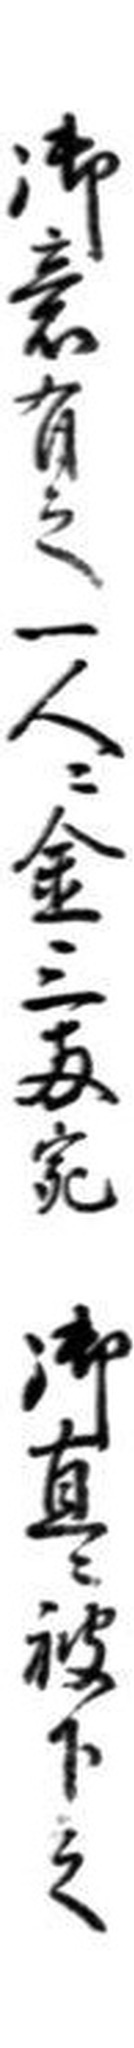御意有之一人ニ金三両宛御直ニ被下之
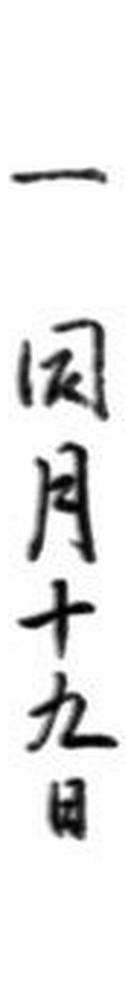一同月十九日
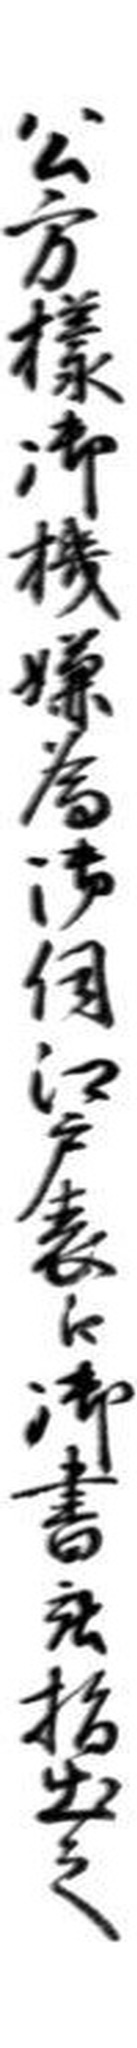公方様御機嫌為御伺江戸表江御書被指出之
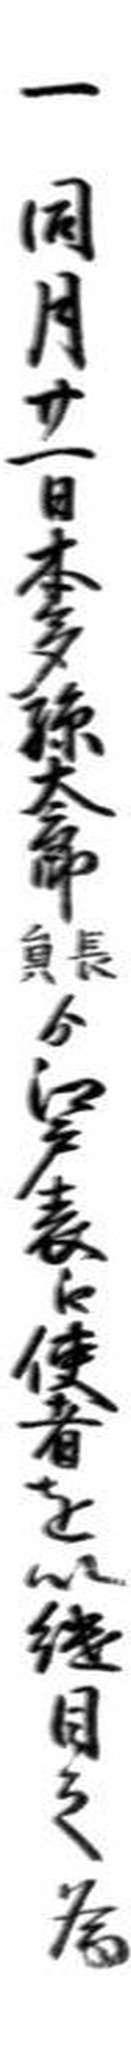一同月廿一日本多孫太郎長員ゟ江戸表江使者を以継目之為
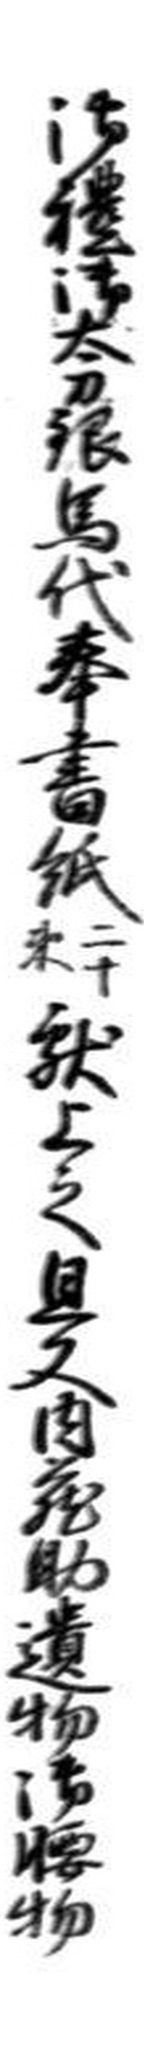御礼御太刀銀馬代奉書紙二十束献上之且又内蔵助遺物御腰物
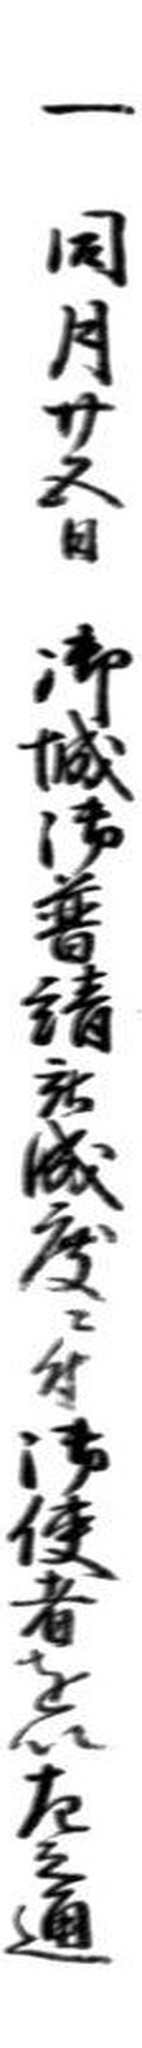一同月廿五日御城御普請被成度ニ付御使者を以左之通
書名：家譜 七 光通公 従寛文四年到同九年
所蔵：福井県文書館 Fukui Prefectural Archives
